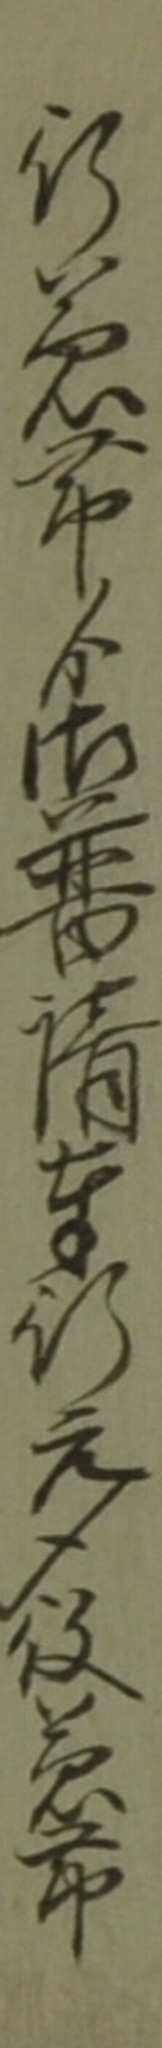行兼帯ゟ御普請奉行元〆役兼帯
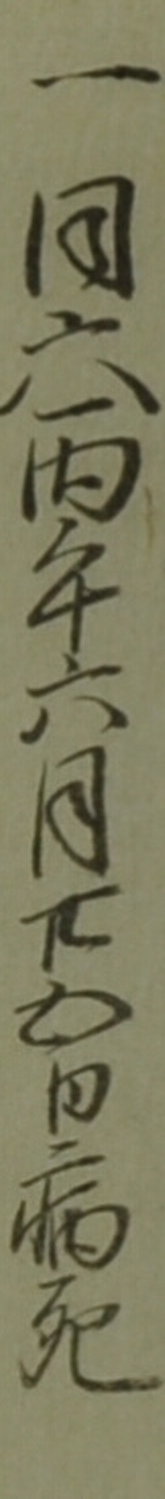一同六丙午六月廿五日病死
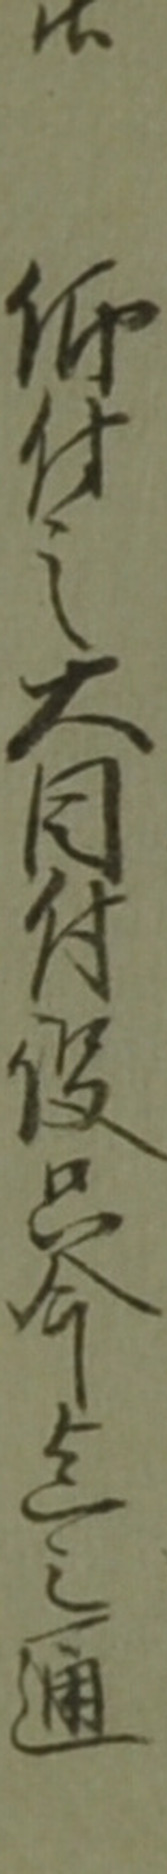被仰付之大目付役只今迄之通
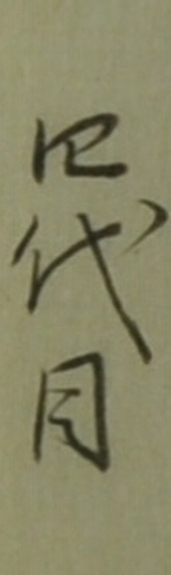四代目

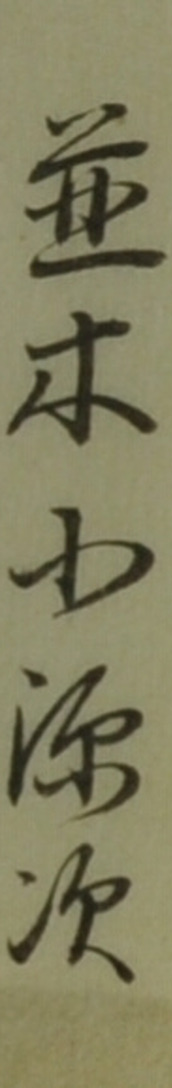並木小源次
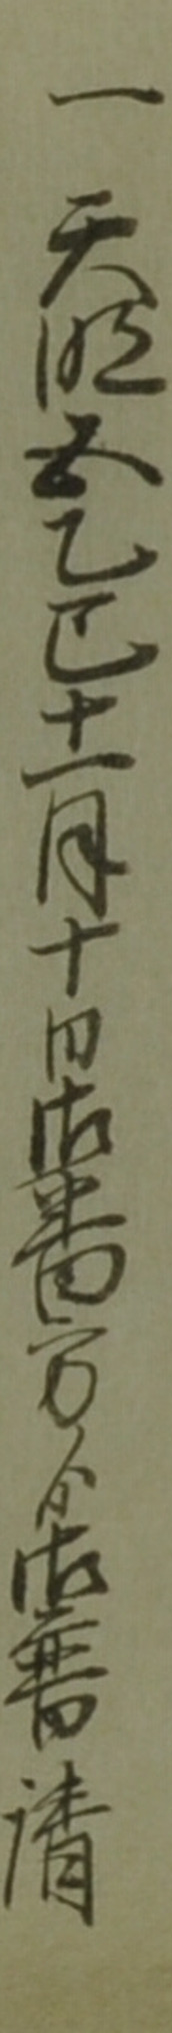一天明五乙巳十一月十日御番方ゟ御普請
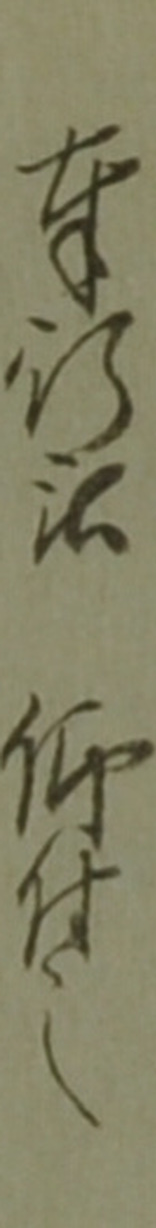奉行被仰付之
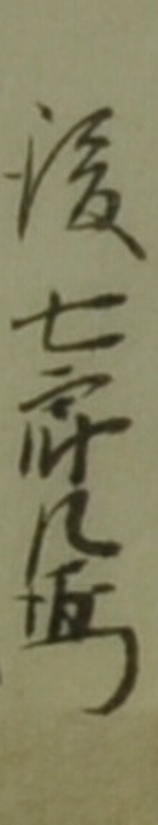後七郎左衛門
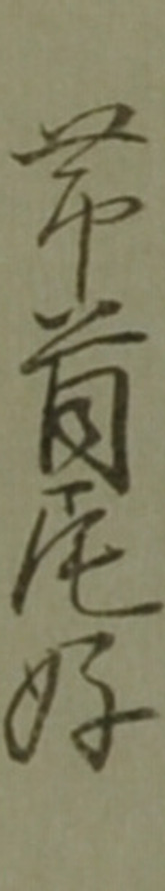帯首尾好
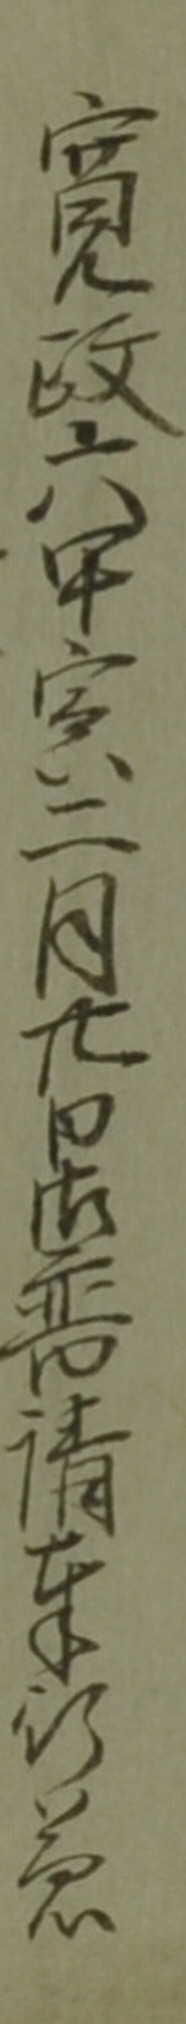一寛政六甲寅二月廿日御普請奉行兼
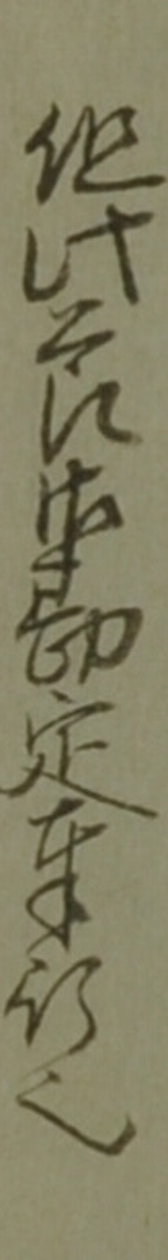但此節御勘定奉行也
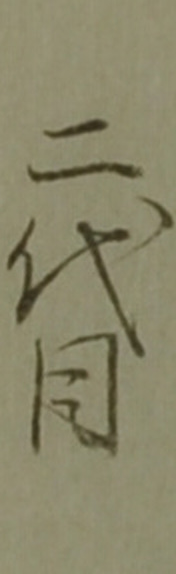二代目
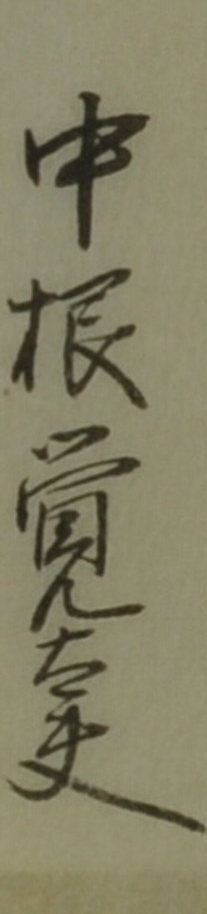中根覚太夫
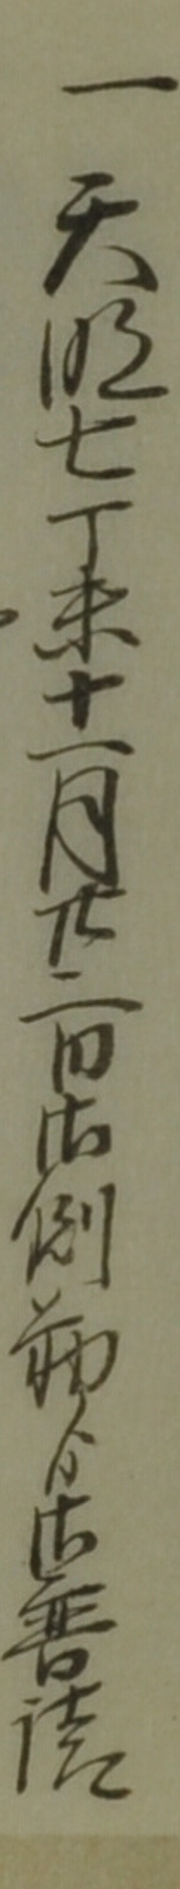一天明七丁未十一月廿二日御側勤ゟ御普請
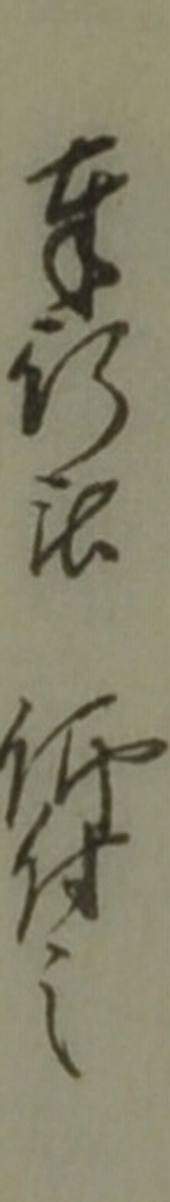奉行被仰付之
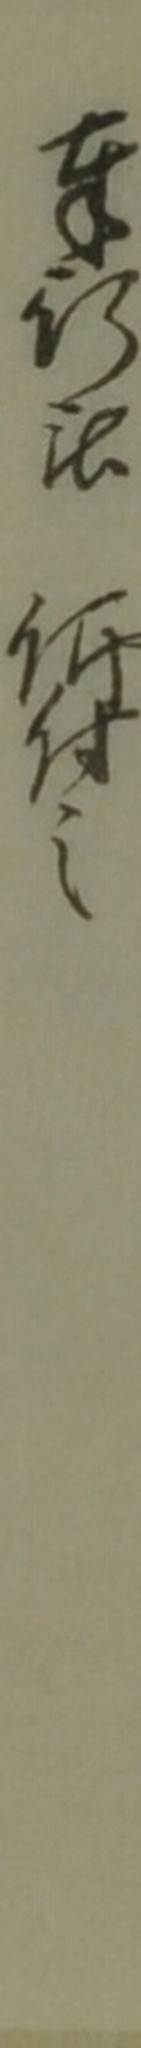奉行被仰付之
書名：諸御役代々録（六）
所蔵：伊那市立高遠町図書館・合同会社AMANE
